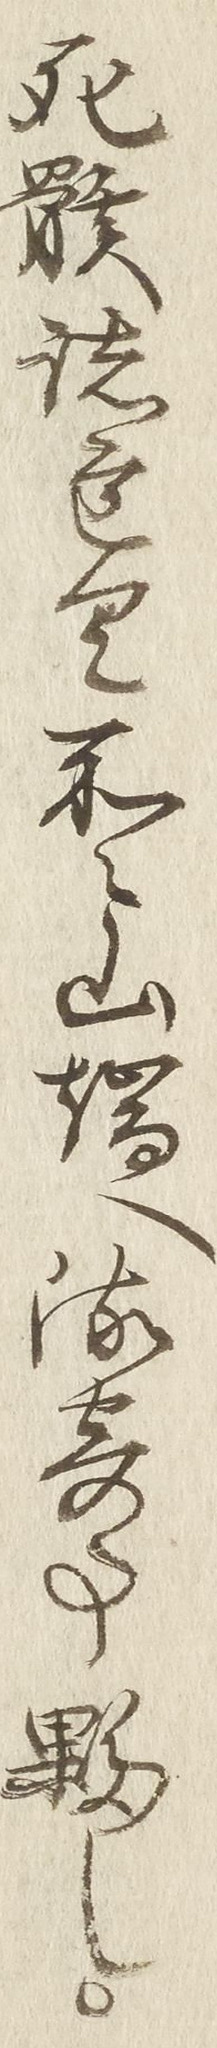死骸諸道具所々山端へ流寄事夥し◦
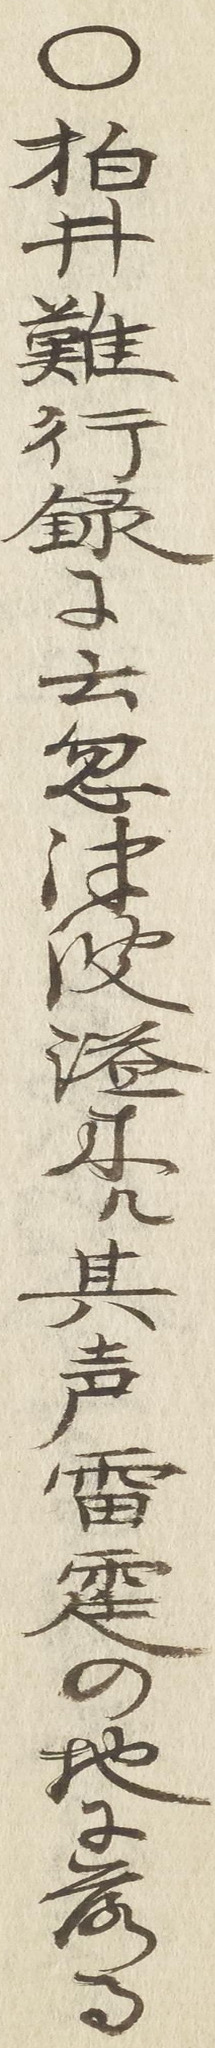〇柏井難行録に云忽ち津波溢来る其声雷霆の地に落る
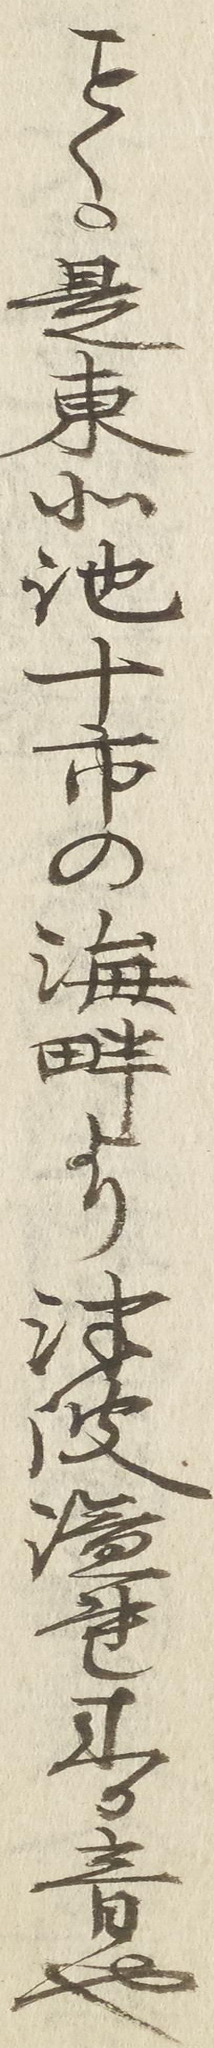ことく◦是東北池十市の海畔より津波溢れ来る音や
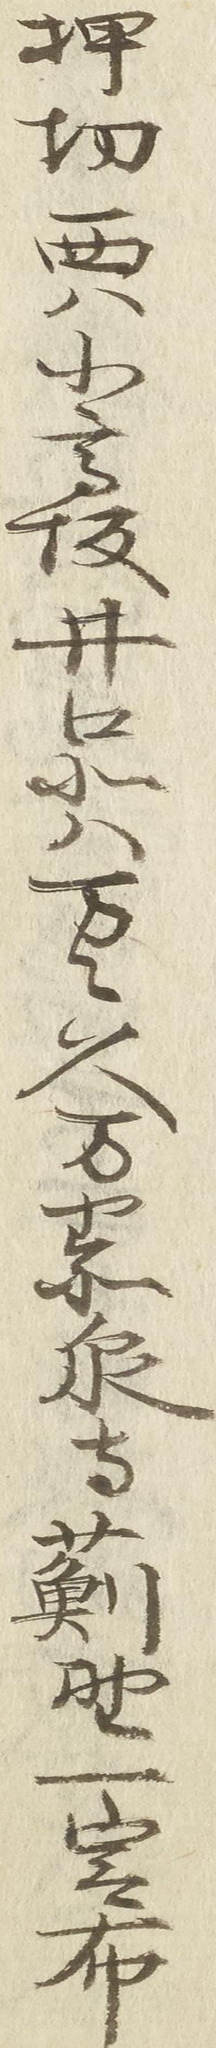押切西は小高坂井口北は万々久万秦泉寺薊野一宮布
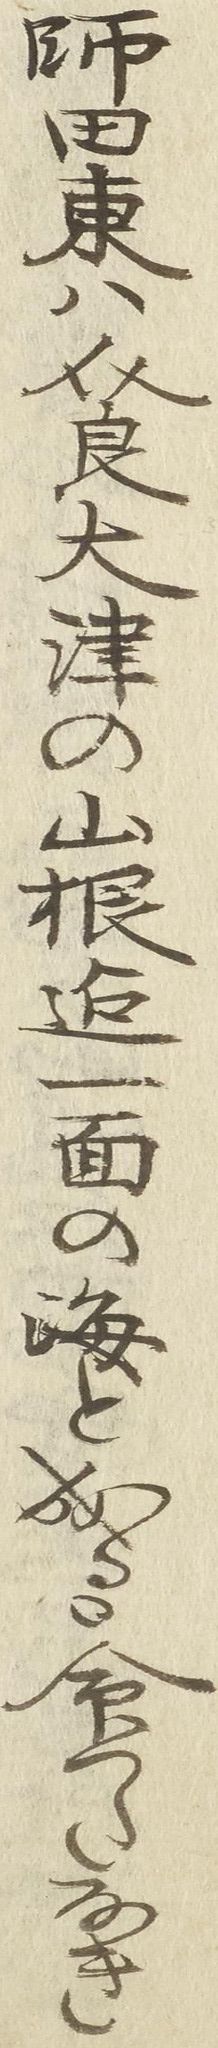師田東は介良大津の山根迄一面の海と成る◦命つたなき

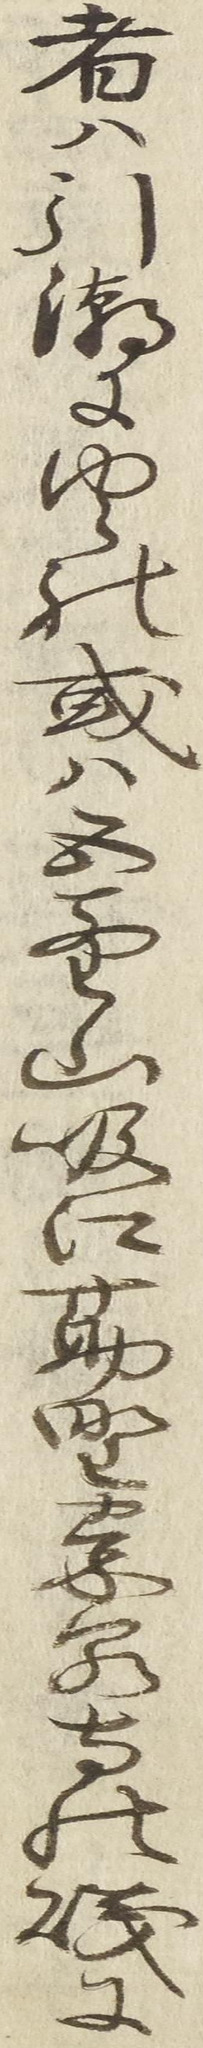者は引潮にゆられ或は五台山吸江莇野秦泉寺の磯に
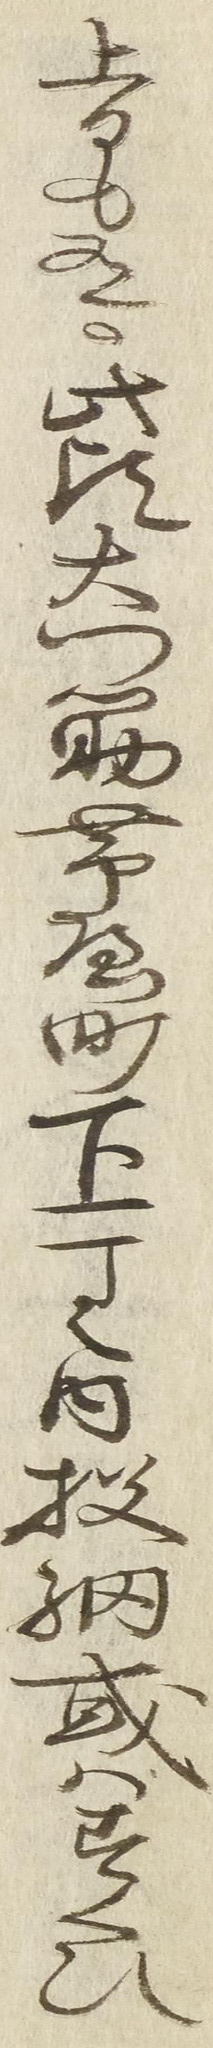上るも有◦此頃大門筋帯屋町下一丁の内投網或はすくひ
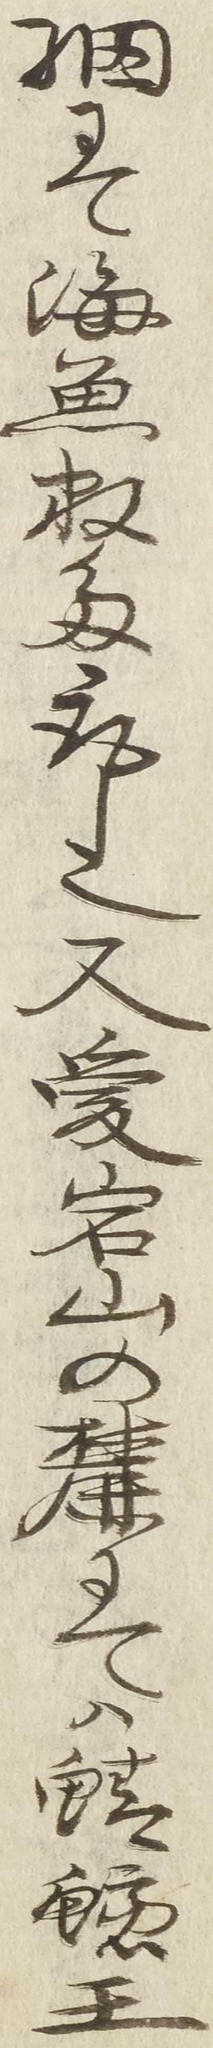網にて海魚数多取也又愛宕山の麓にては鯖鱩王
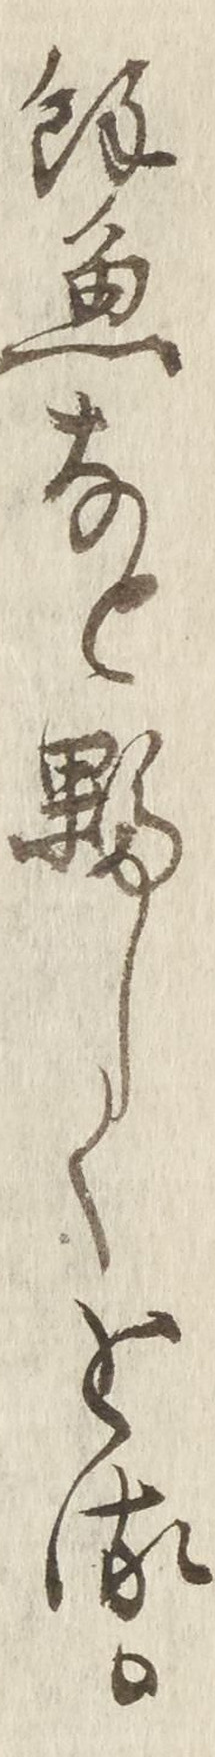余魚なと夥しくとる◦
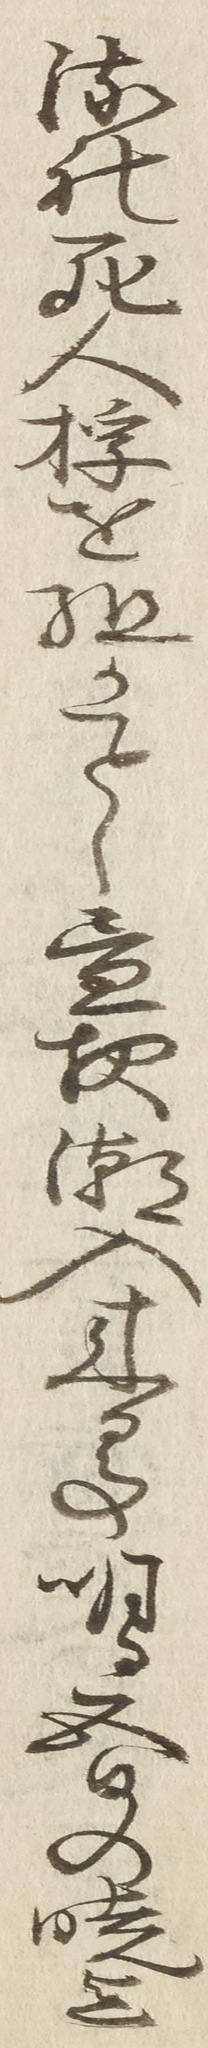流れ死人桴を組かことし昼夜潮入来る事明る五日の暁迄
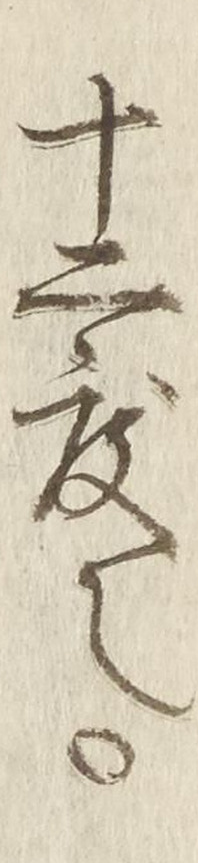十二度也◦
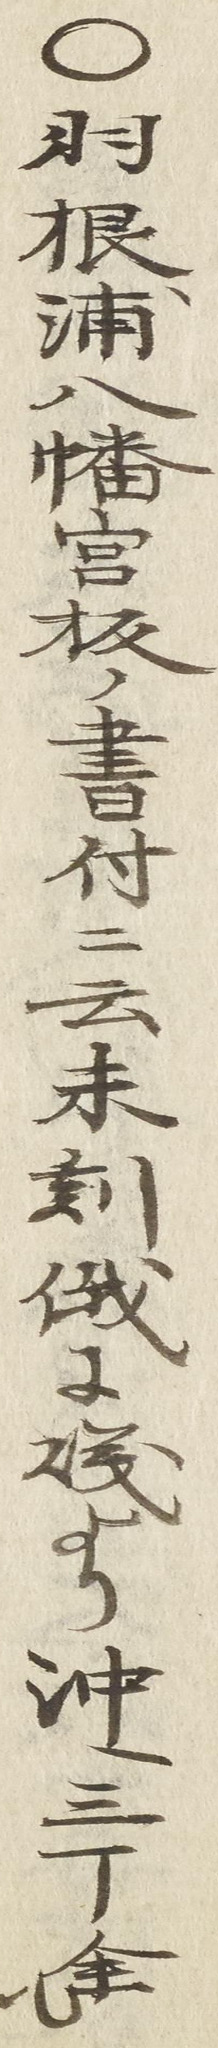〇羽根浦八幡宮板の書付に云未刻俄に磯より沖へ三丁余も
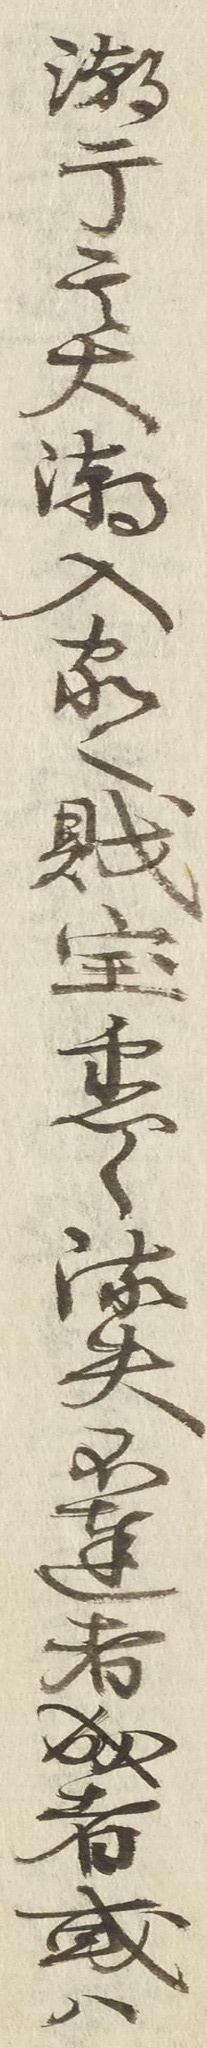潮干其大潮入家の財宝悉く流失不達者成者或は
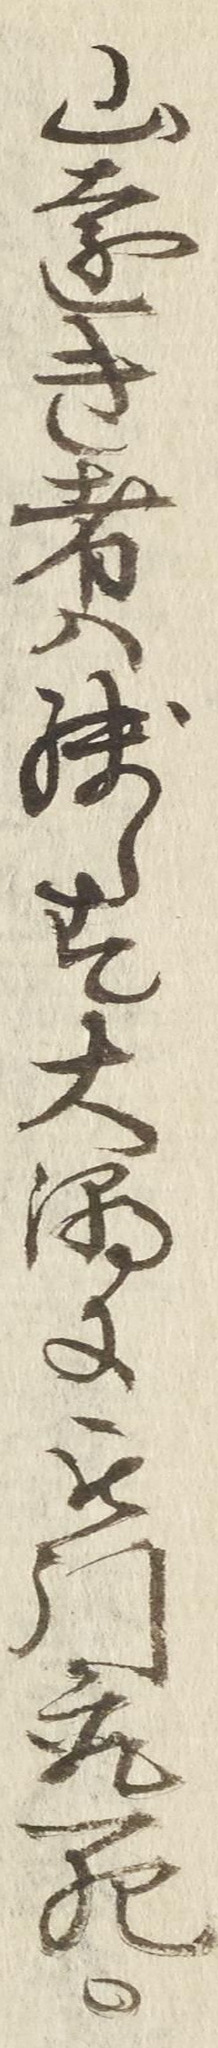山遠き者は残らず大潮に被引取死◦
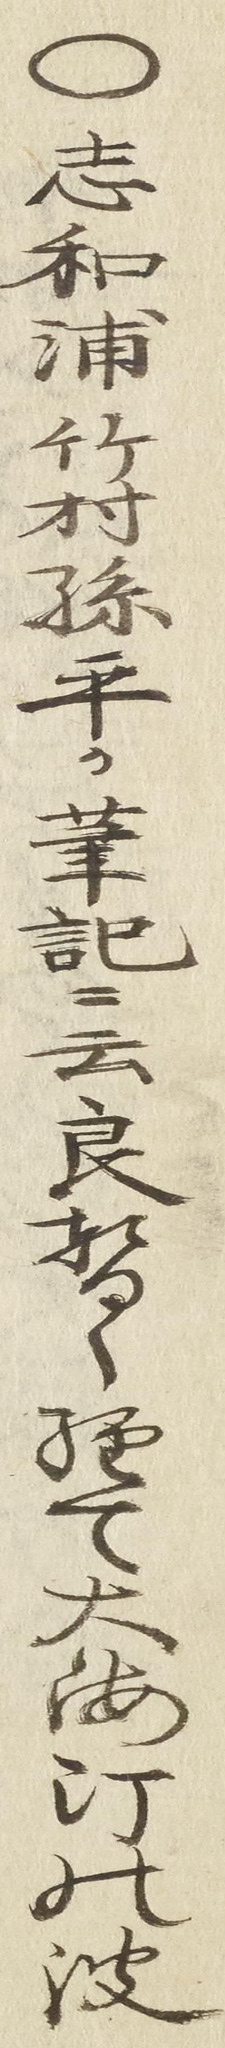〇志和浦武村孫平の葦記に云良暫く経て大海汀の波
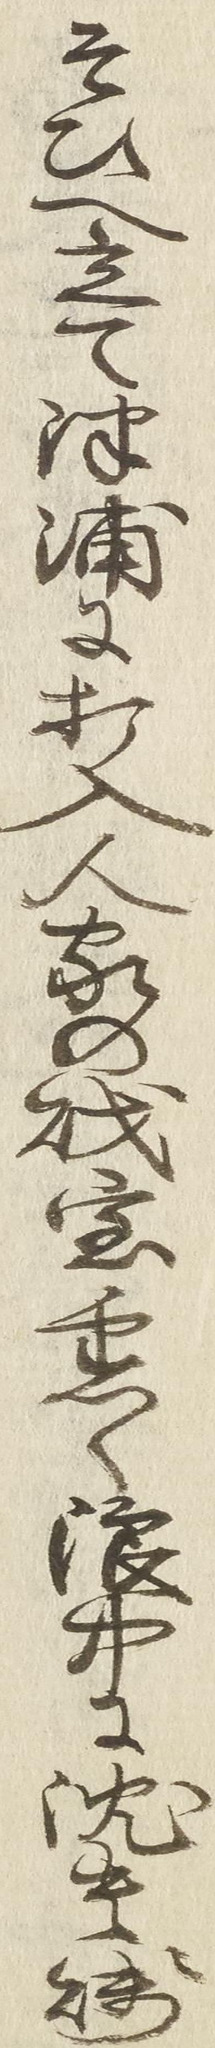そひへ立て津浦に打入人家の財宝悉く浪中に沈貴賤
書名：地震記　上
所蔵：東京大学地震研究所図書室 Earthquake Research Institute Library, The University of Tokyo, JAPAN
